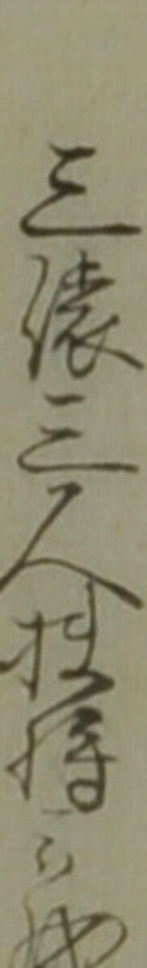三俵三人扶持被成下
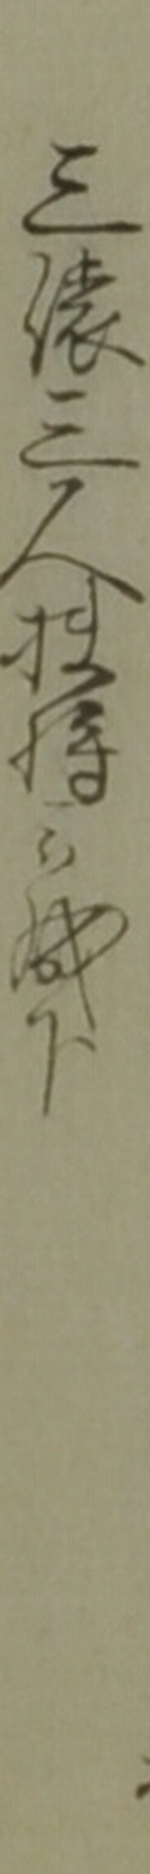三俵三人扶持被成下
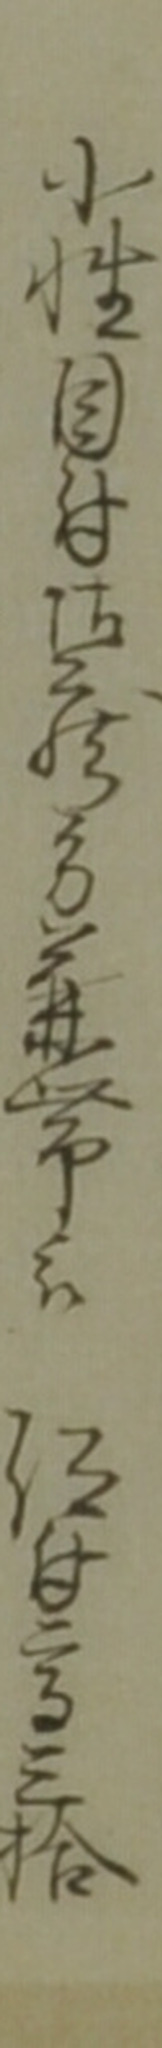小性目付御蔵方兼帯被仰付高三拾
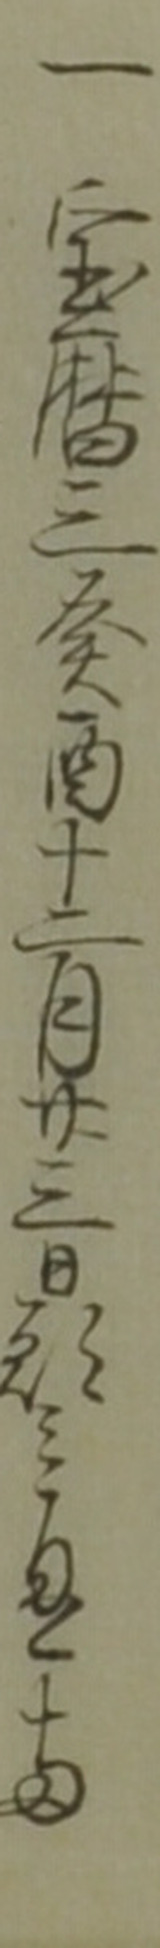一宝暦三癸酉十二月廿三日願之通両
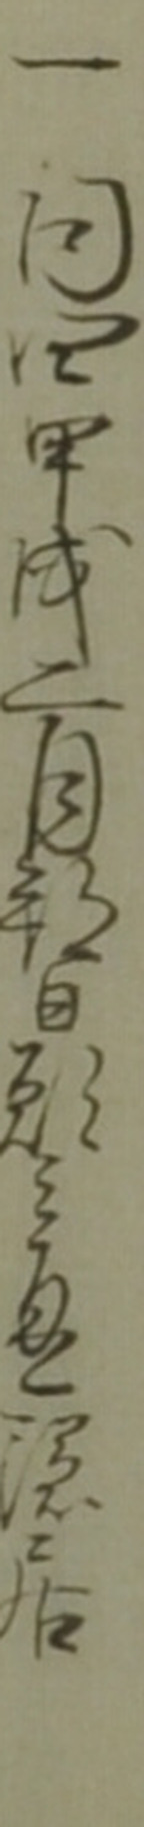一同四甲戌二月朔日願之通隠居
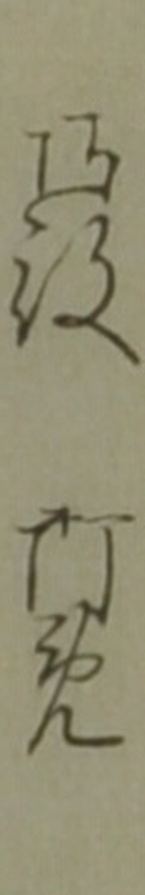御役御免
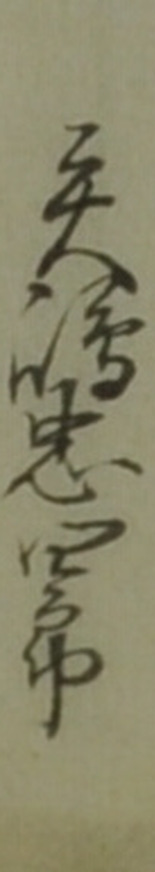矢嶋忠四郎
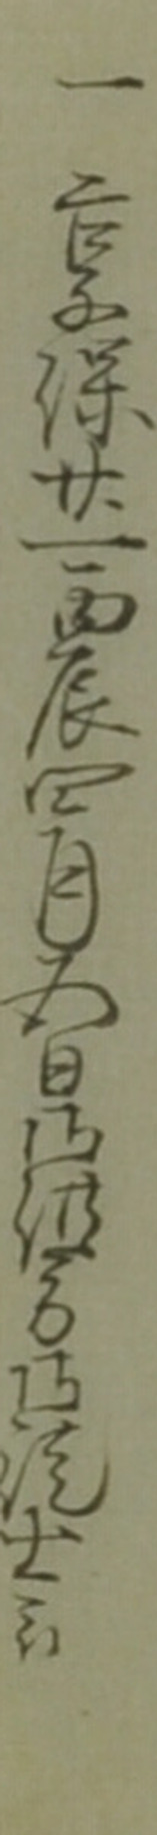一享保廿一丙辰四月五日御供方御徒士被
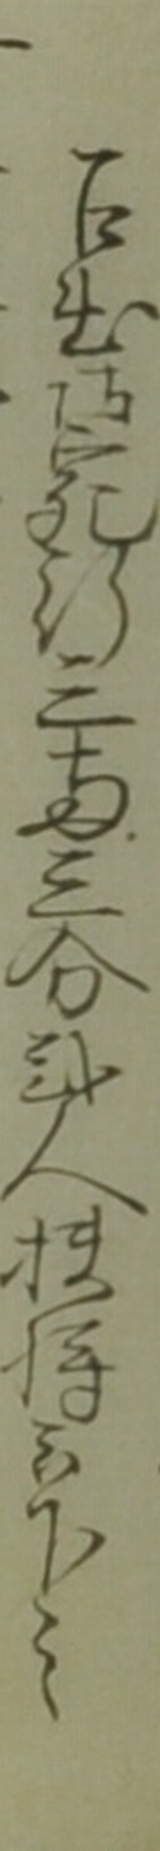召出御宛行三両三分弐人扶持被下之
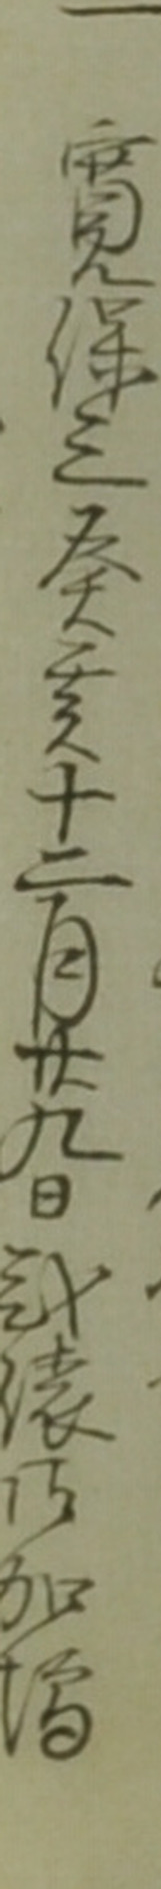一寛保三癸亥十二月廿九日弐俵御加増
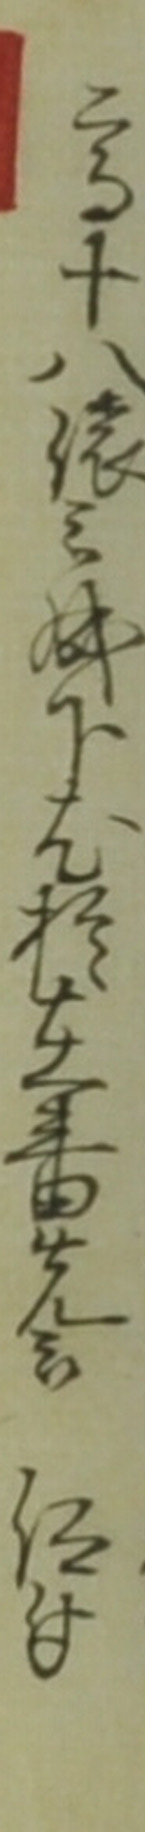高十八俵被成下尤於在番先被仰付

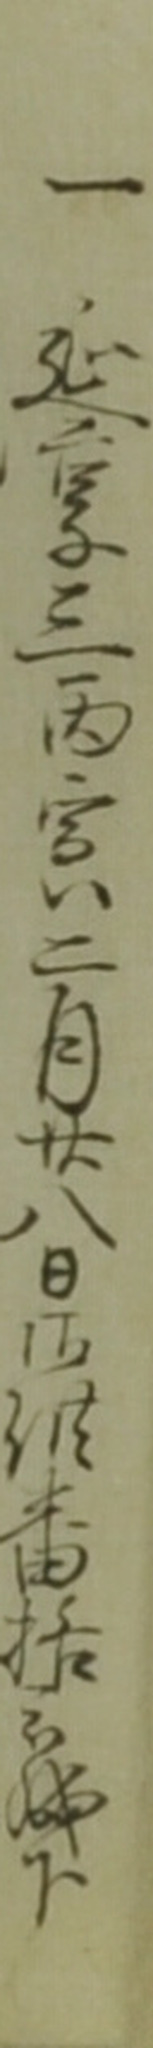一延享三丙寅二月廿八日御供番格被成下
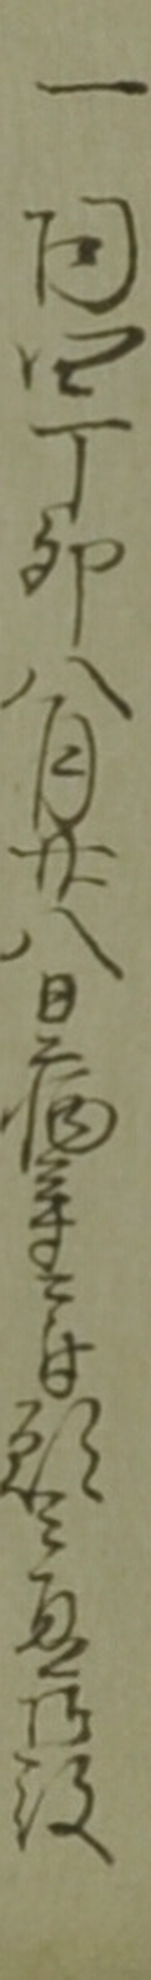一同四丁卯八月廿八日病気ニ付願之通御役
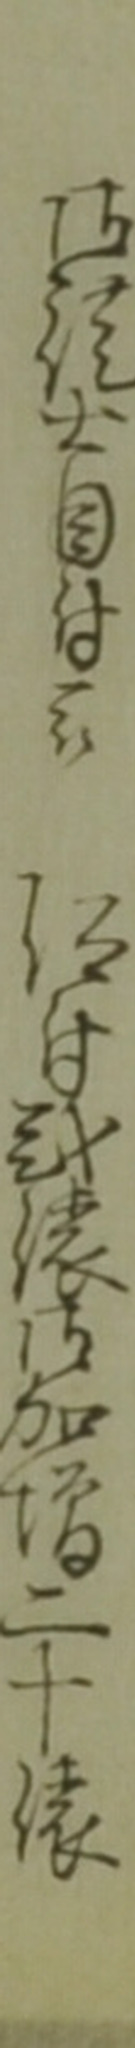御徒士目付被仰付弐俵御加増二十俵
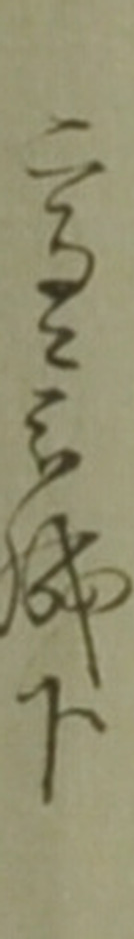高ニ被成下
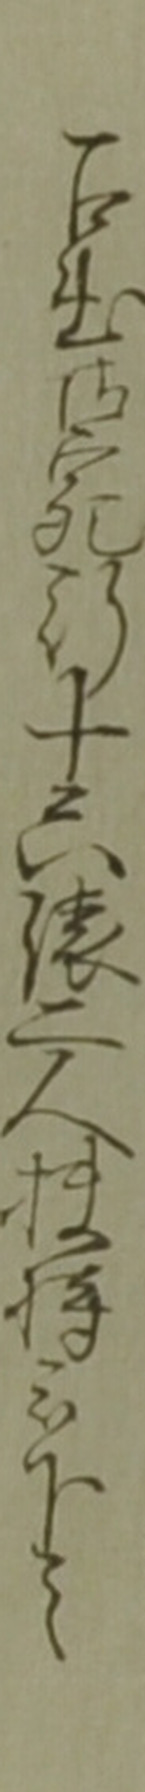召出御宛行十六俵二人扶持被下之
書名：無足諸士勤仕録（一）
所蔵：伊那市立高遠町図書館・合同会社AMANE
